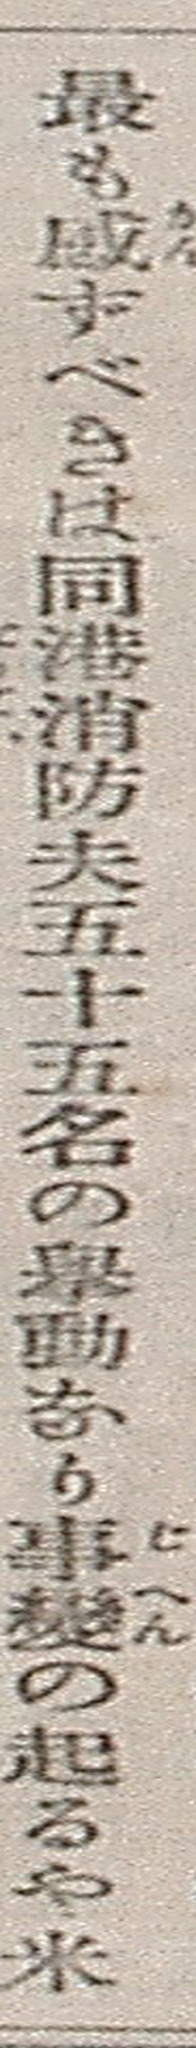最も感ずべきは同港消防夫五十五名の挙動なり事変の起るや米
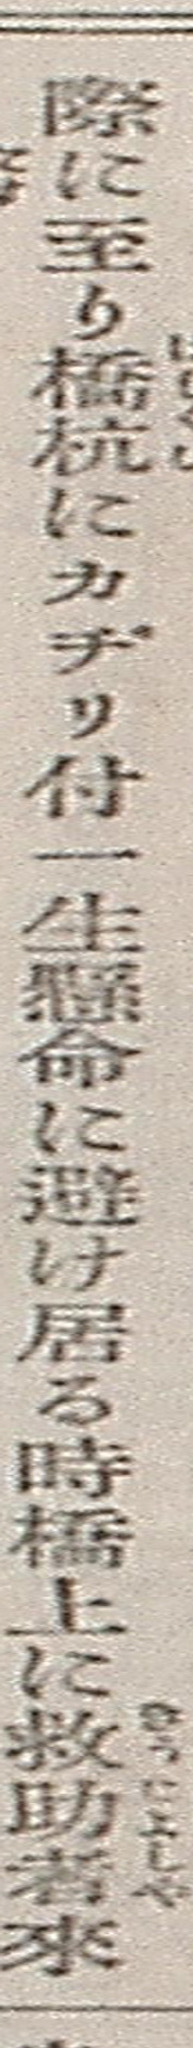際に至り橋杭にカヂリ付一生懸命に避け居る時橋上に救助者来
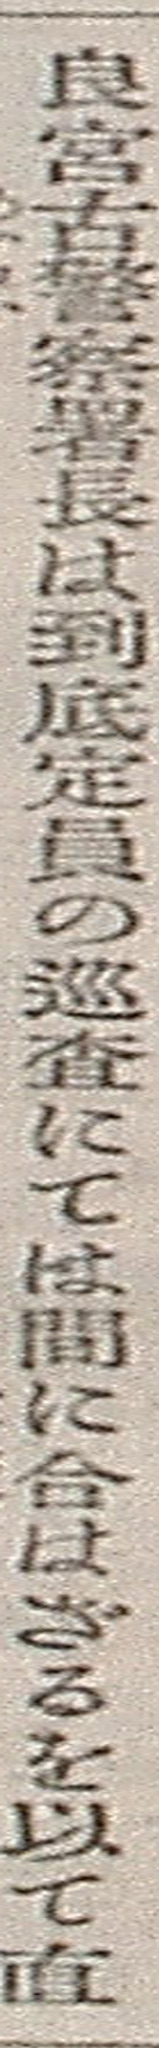良宮古警察署長は到底定員の巡査にては間に合はざるを以て直
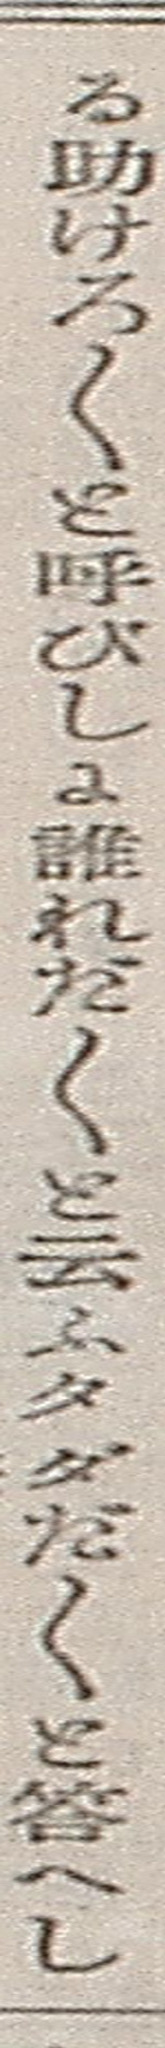る助けろ〳〵と呼びしに誰れだ〳〵と云ふタダだ〳〵と答へし
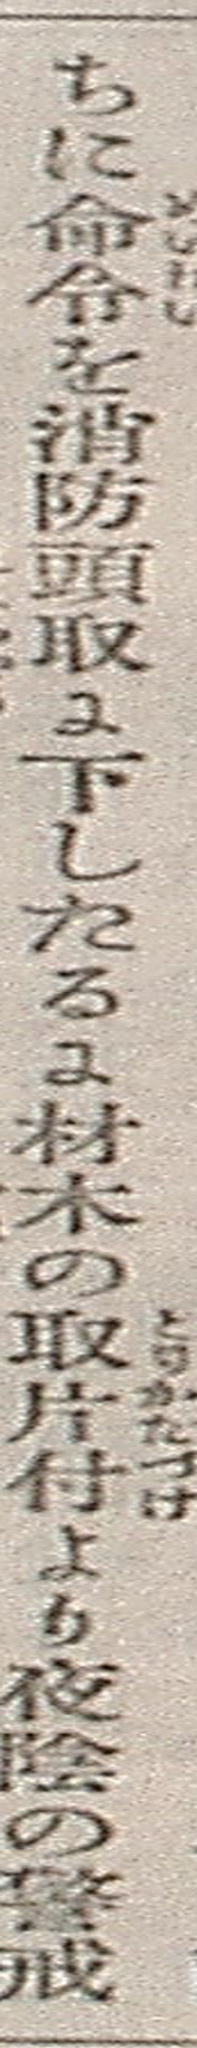ちに命令を消防頭取に下したるに材木の取片付より夜陰の警戒
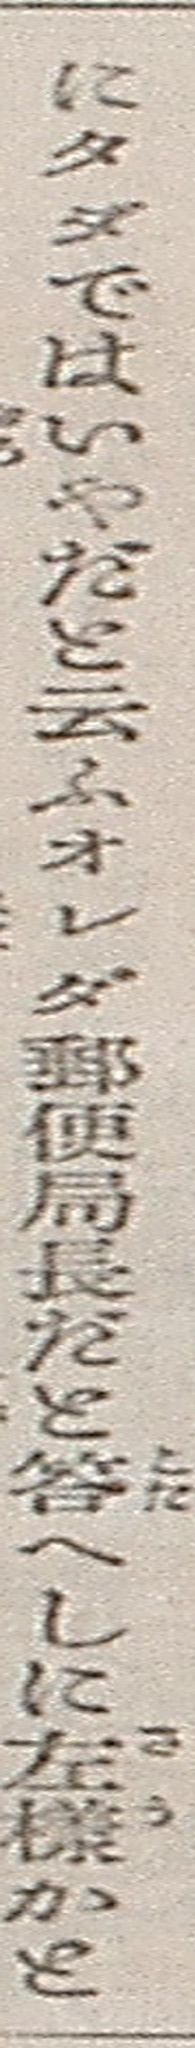にタダではいやだと云ふオレダ郵便局長だと答へしに左様かと
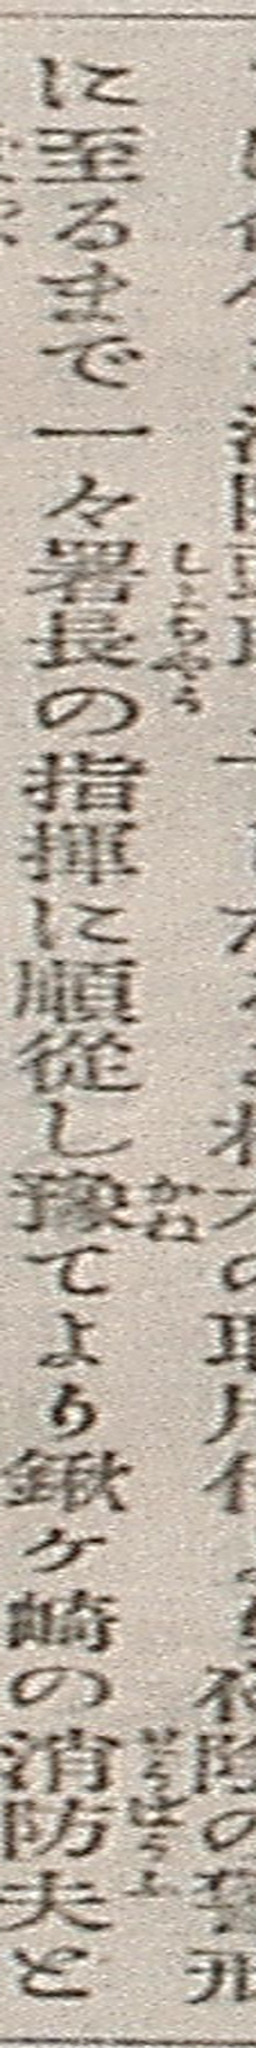に到るまで一々署長の指揮に順従し予てより鍬ヶ崎の消防夫と
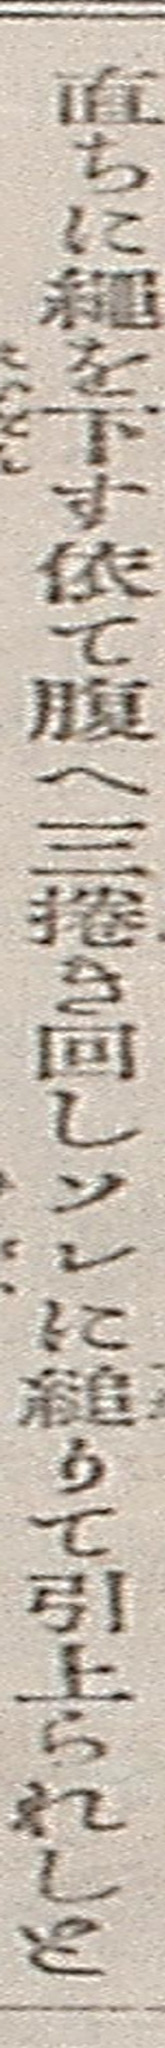直ちに縄を下す依て腹へ三捲き回しソレに縋りて引上られしと
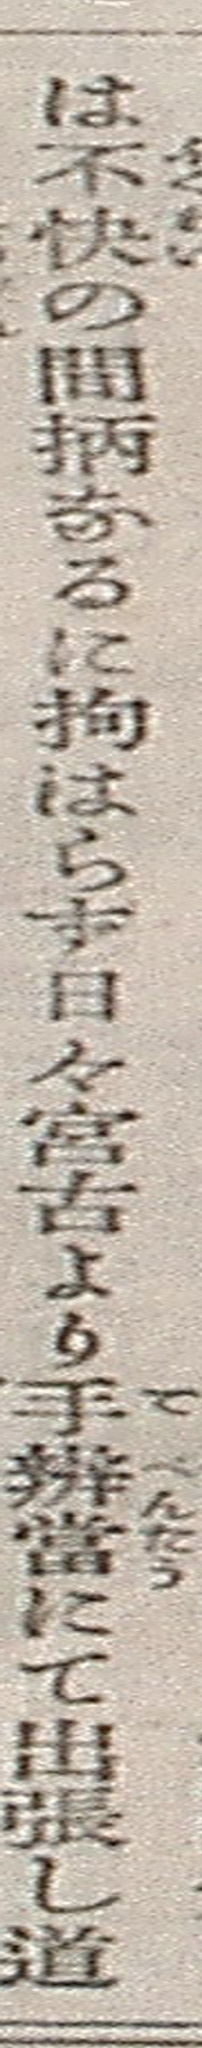は不快の間柄なるに拘はらず日々宮古より手弁当にて出張し道
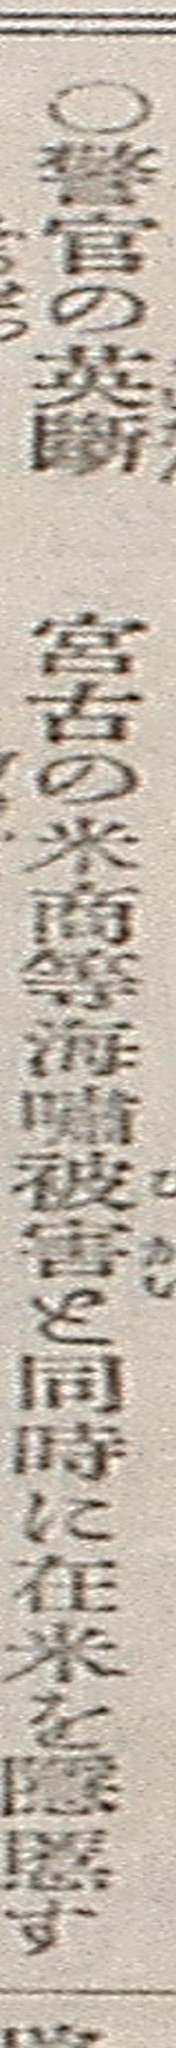○警官の英断宮古の米商等海嘯被害と同時に在米を隠匿す
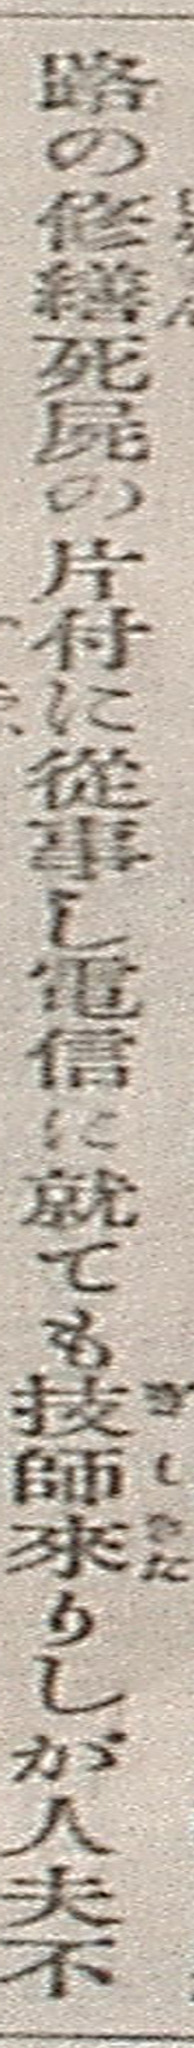路の修繕死屍の片付に従事し電信に就ても技師来りしが人夫不
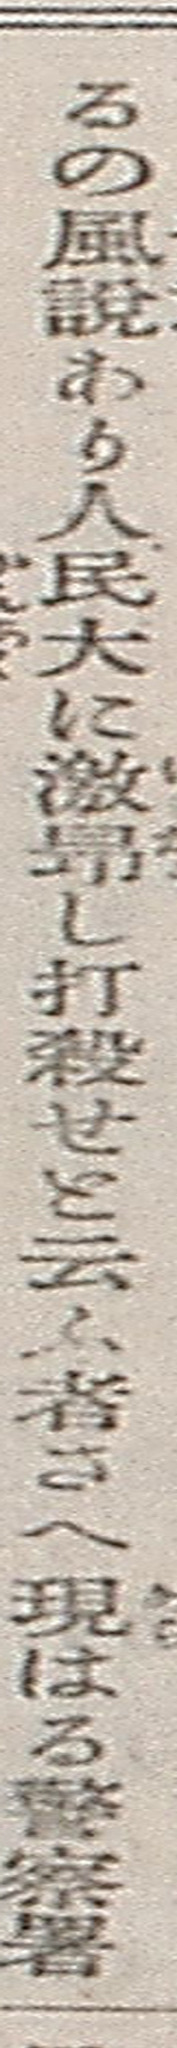るの風説あり人民大に激昂し打殺せと云ふ者さへ現はる警察署
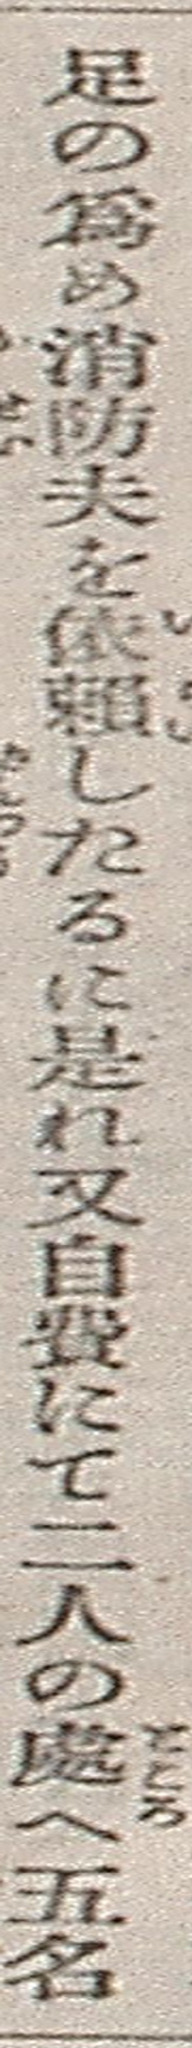足の為め消防夫を依頼したるに是れ又自費にて二人の処へ五名
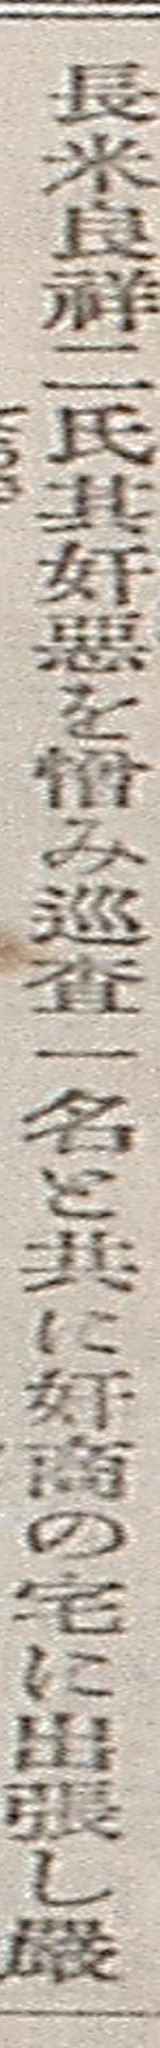長米良祥二氏其奸悪を憎み巡査一名と共に奸商の宅に出張し厳
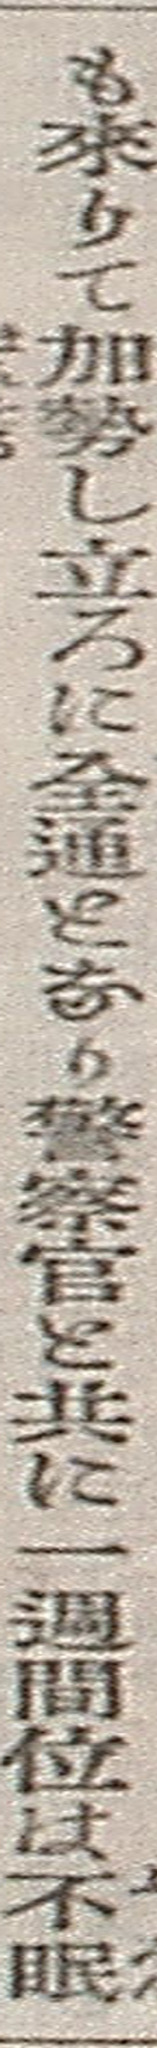も来りて加勢し立所に全通となり警察官と共に一週間位は不眠
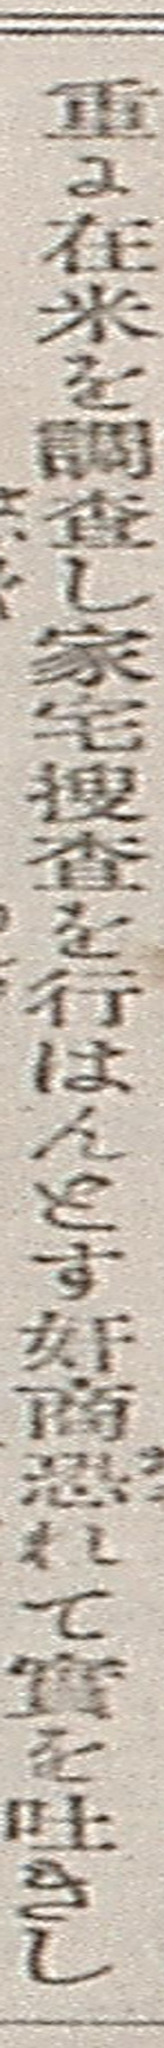重に在米を調査し家宅捜査を行はんとす奸商恐れて実を吐きし
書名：風俗畫報臨時増刊第百十九號　大海嘯被害録（中）
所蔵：東京大学地震研究所図書室 Earthquake Research Institute Library, The University of Tokyo, JAPAN
